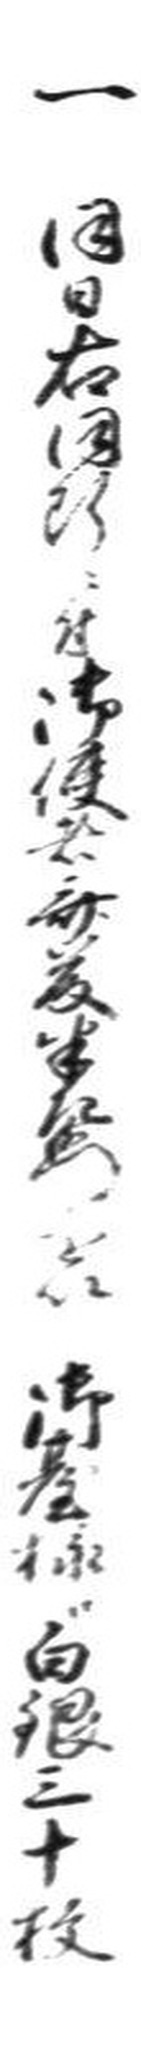一同日右同断ニ付御使者斎藤半左衛門を以御台様江白銀三十枚
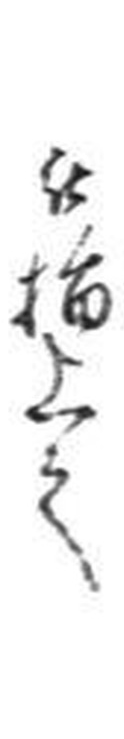被指上之
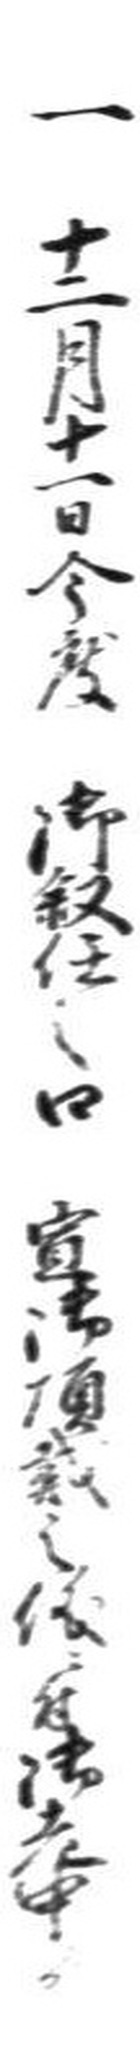一十二月十一日今度御叙任之口宣御頂戴之儀ニ付御老中ゟ
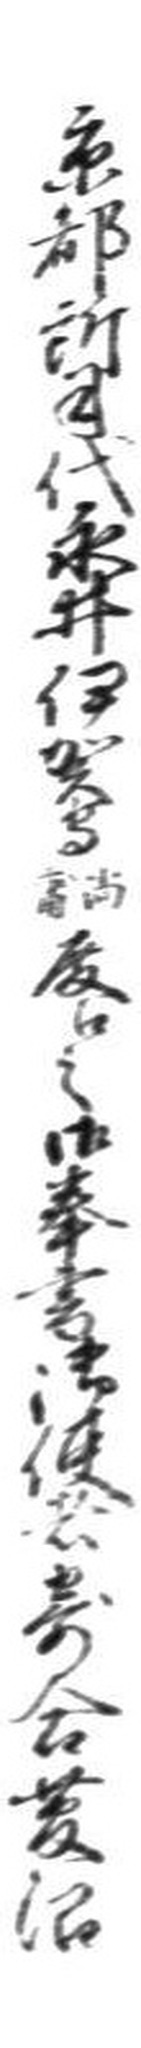京都所司代永井伊賀守尚庸殿江之御奉書御使者寄合菅沼
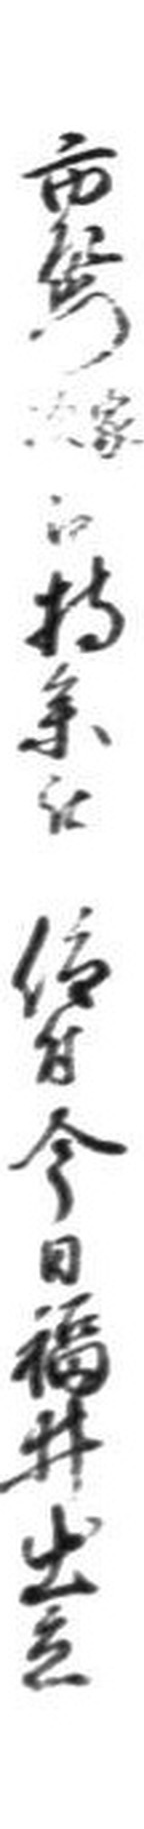市左衛門家次江持参被仰付今日福井出立
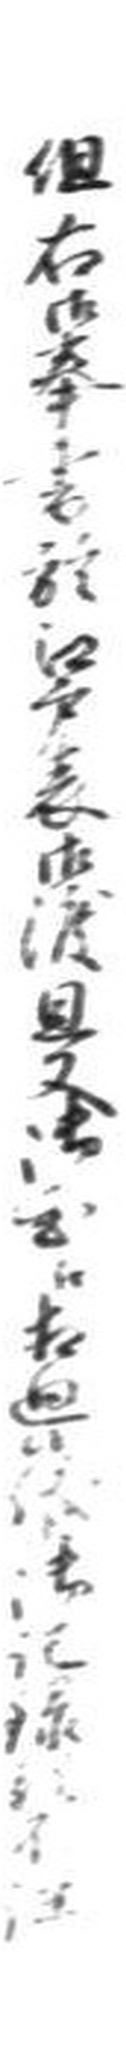但右御奉書於江戸表御渡且又御国江相廻候儀御記録類不詳
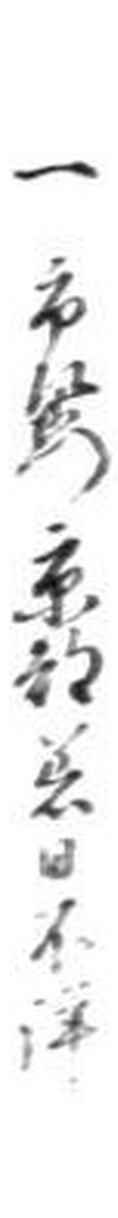一市左衛門京都着日不詳

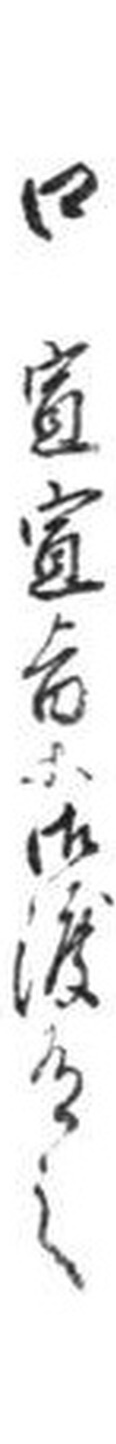口宣宣旨等御渡有之
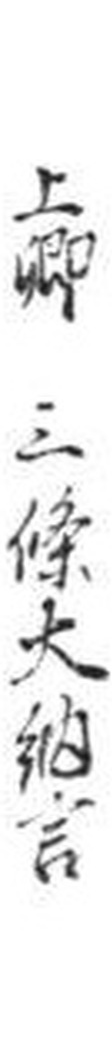上卿三条大納言
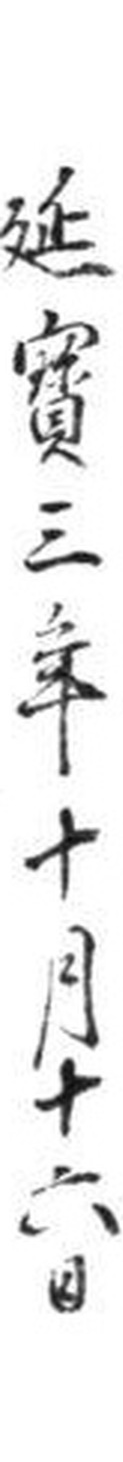延宝三年十月十六日
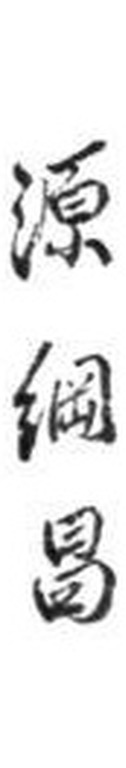源綱昌
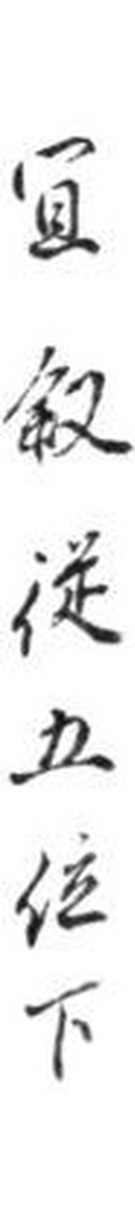宜叙従五位下奉
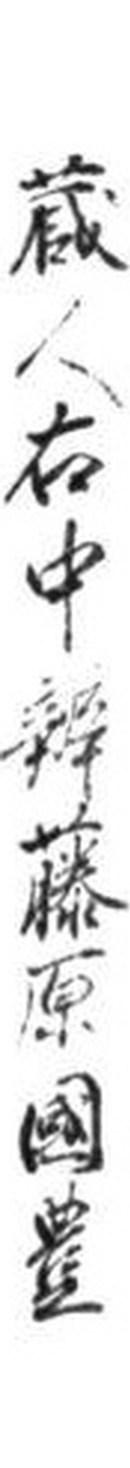蔵人右中弁藤原国豊
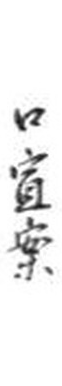口宣案
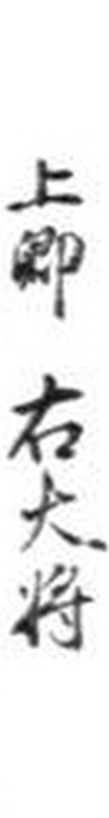上卿右大将
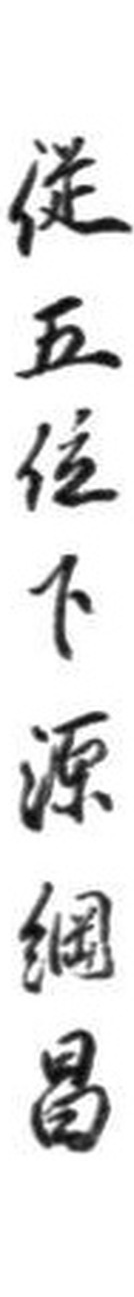従五位下源綱昌
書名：家譜 十三 綱昌公 従寛文元年到延宝五年
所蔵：福井県文書館 Fukui Prefectural Archives
